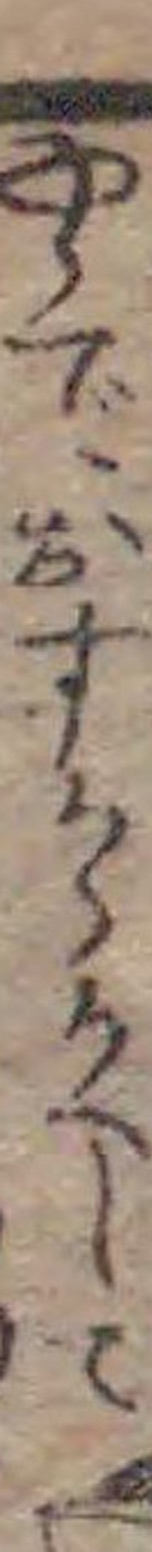やらでおすからかえして
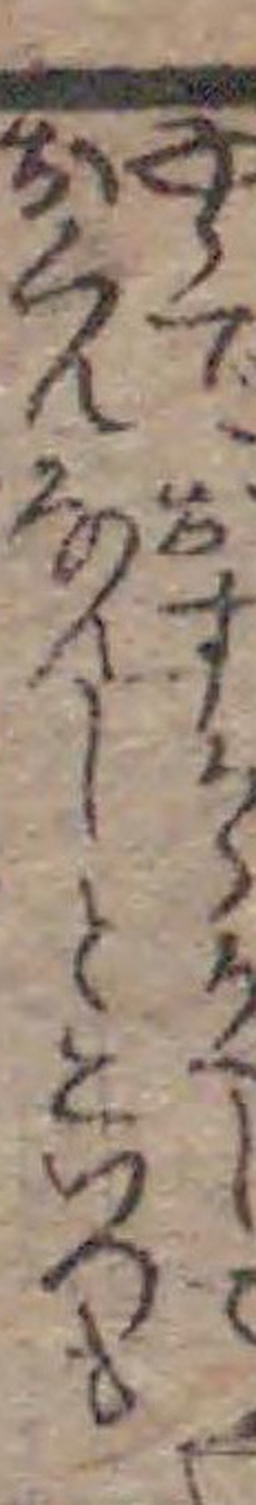おくんなんしといつて
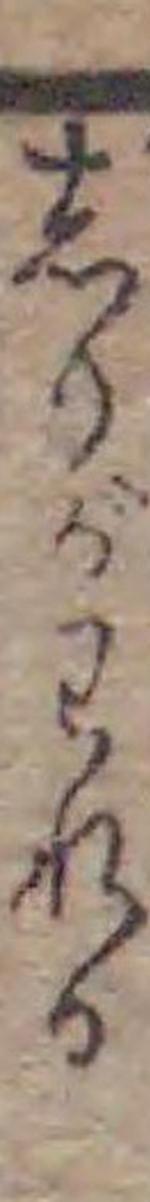しりがわれる
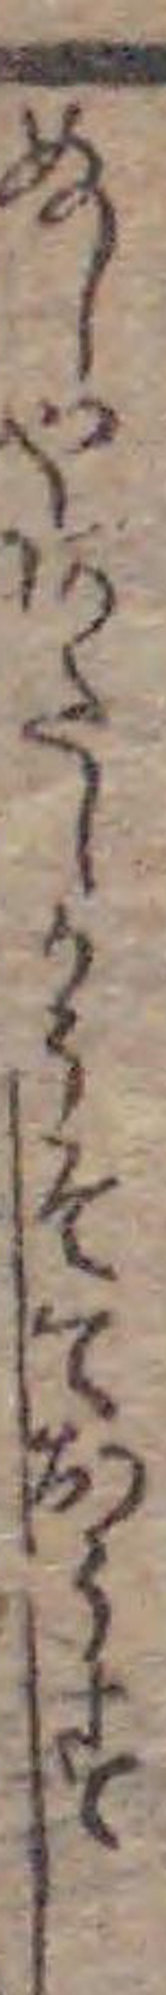ぬしやあたしかうそておうす
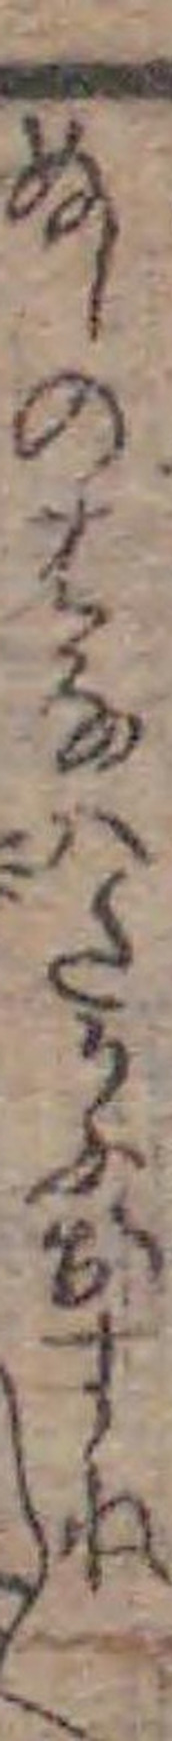ぬしのはなはたかふおすね
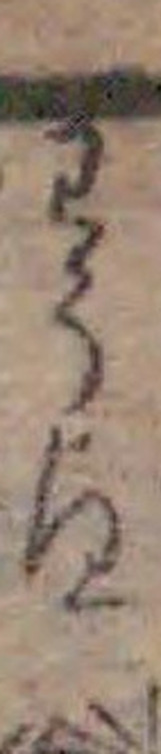わう様
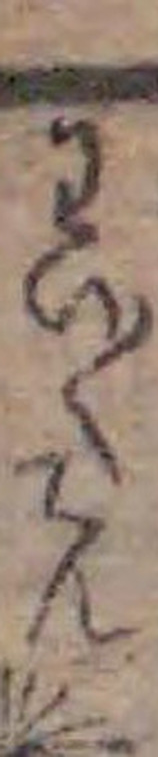わい〳〵てん
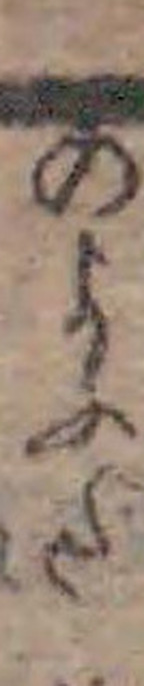のよふだ

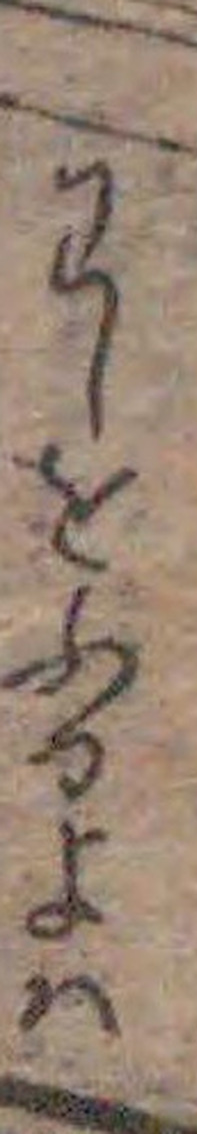わしをふるよは
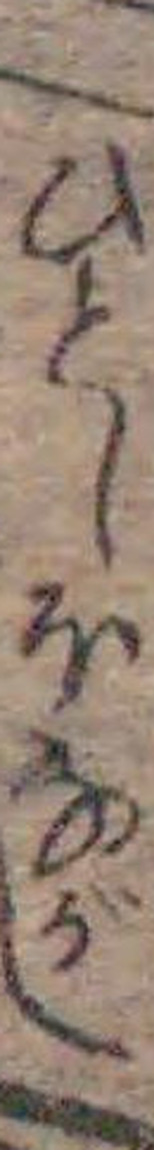ひとしほながし
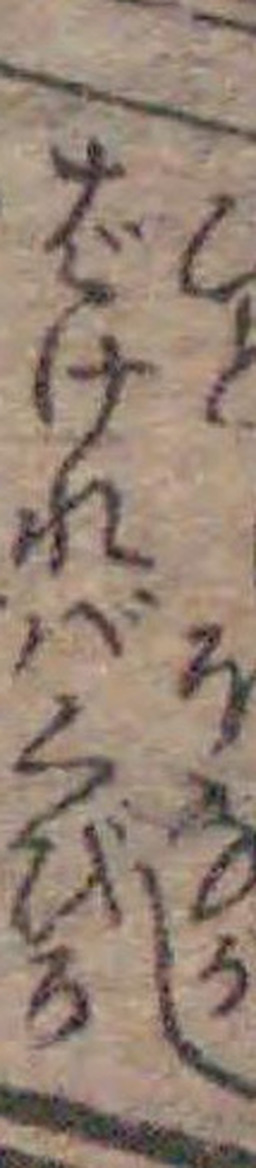ばければくびか
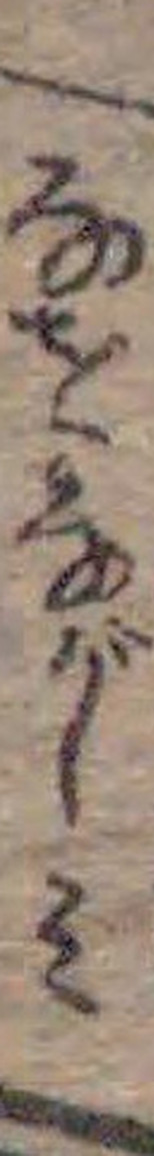なをながしみ
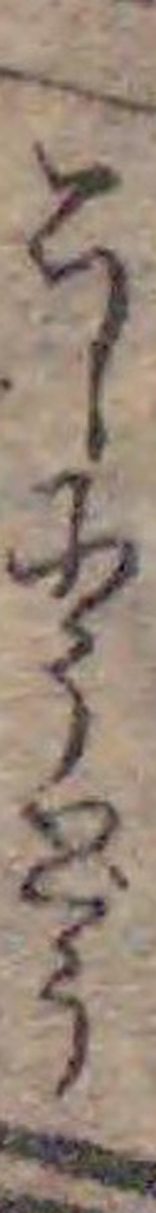こしにうどう
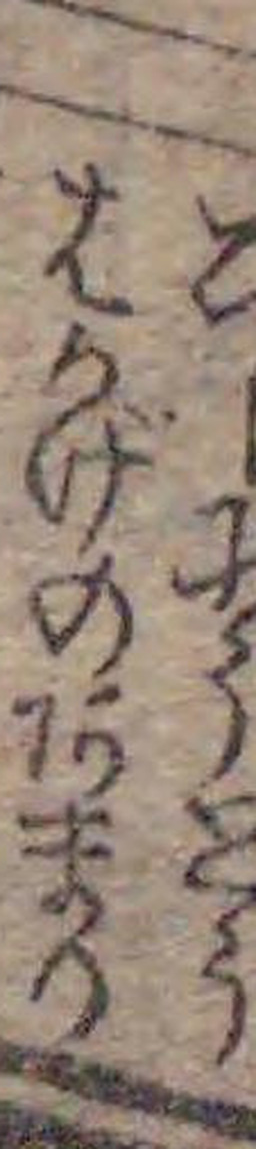はかげのあまり
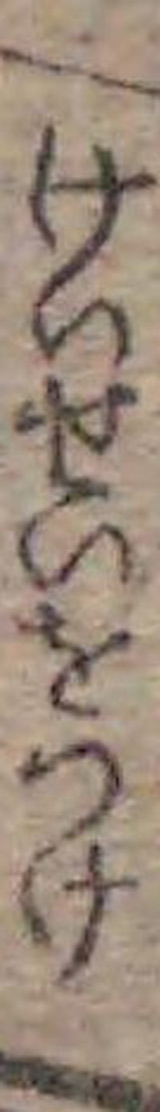けいせいをつけ
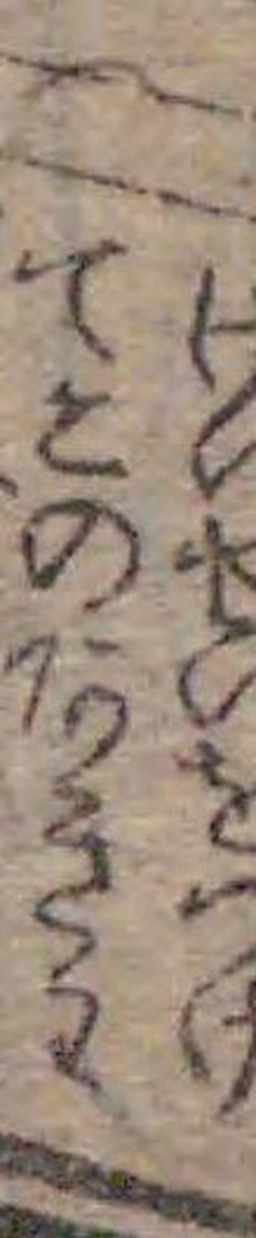てこのあきわ
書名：化物楽屋異牒 : 2巻
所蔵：国立国会図書館 National Diet Library, JAPAN
